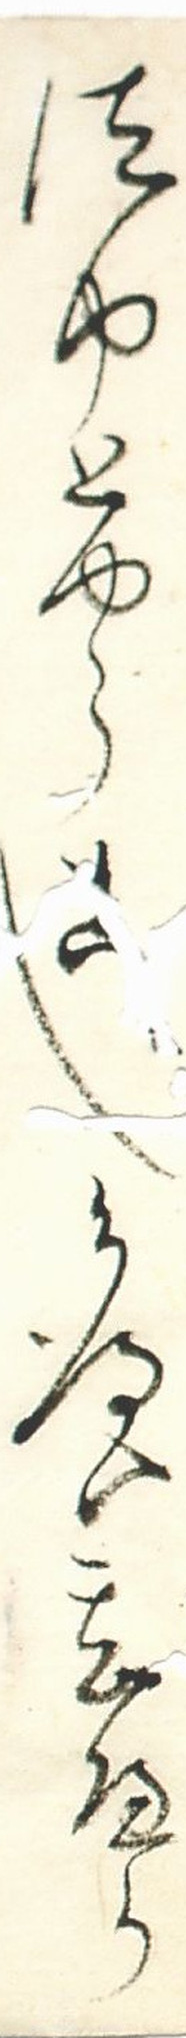つゆとゆらし候得は其通り

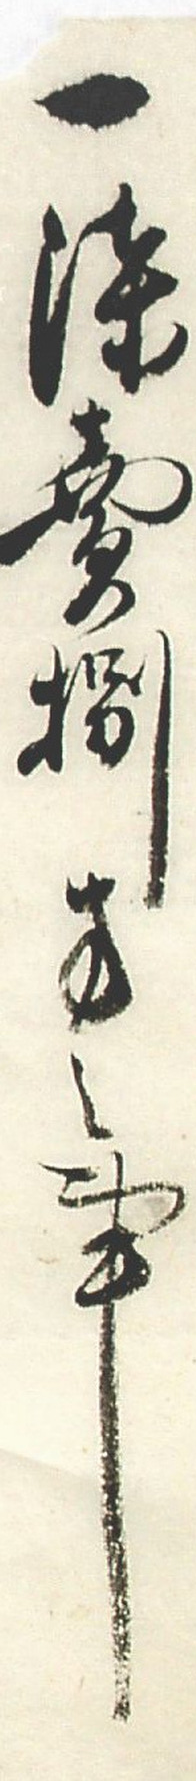一漆売捌方之事
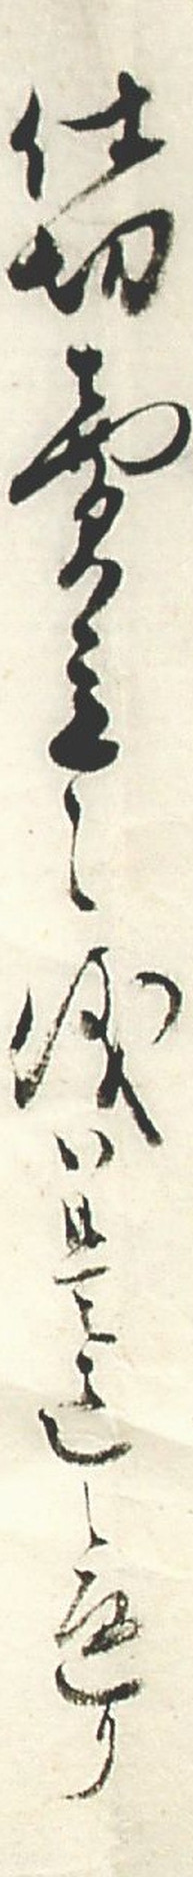仕切売主之儀は是迄之通り
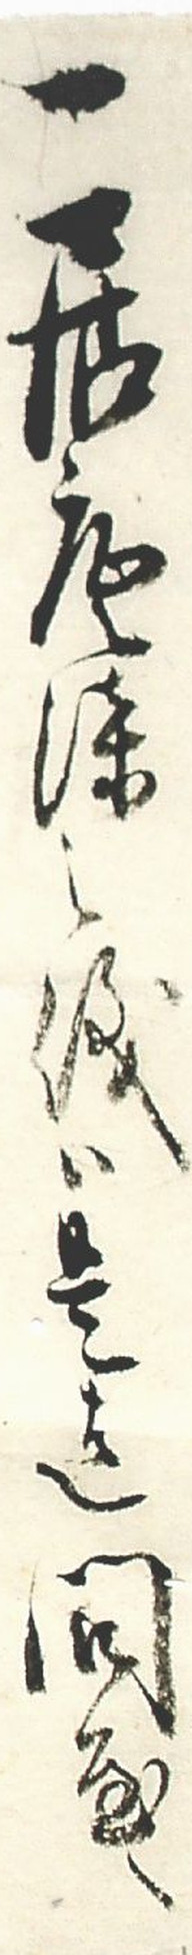一居屋漆之儀は是迄問屋へ
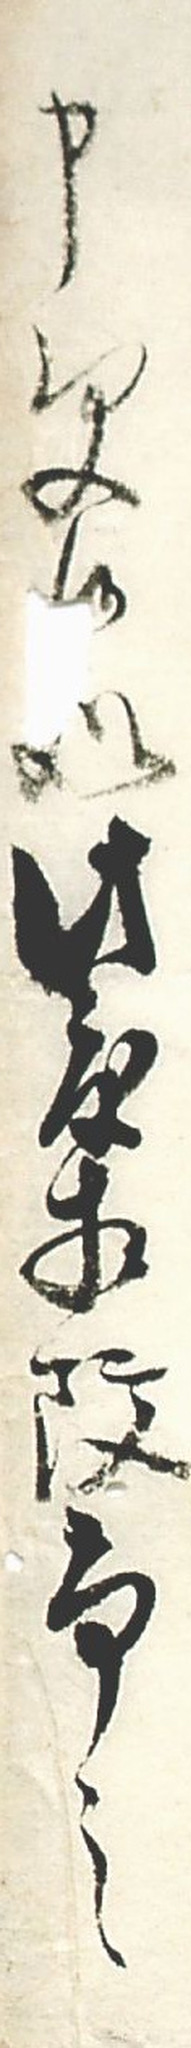申受候処此度相改高之
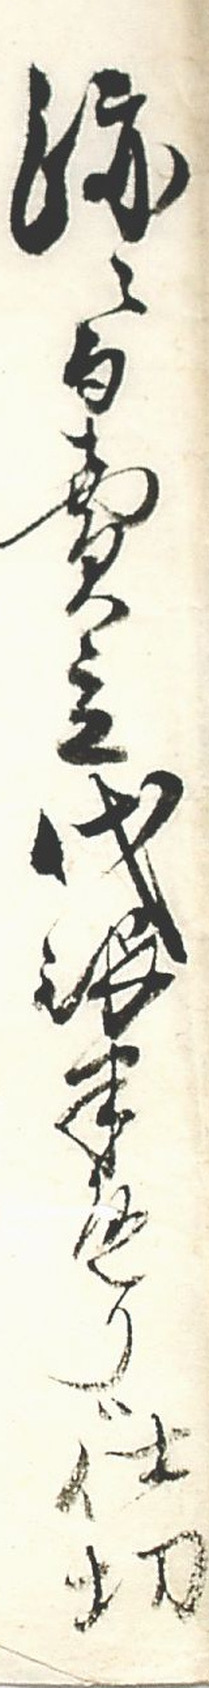跡に而売立代銀半通りは仕切
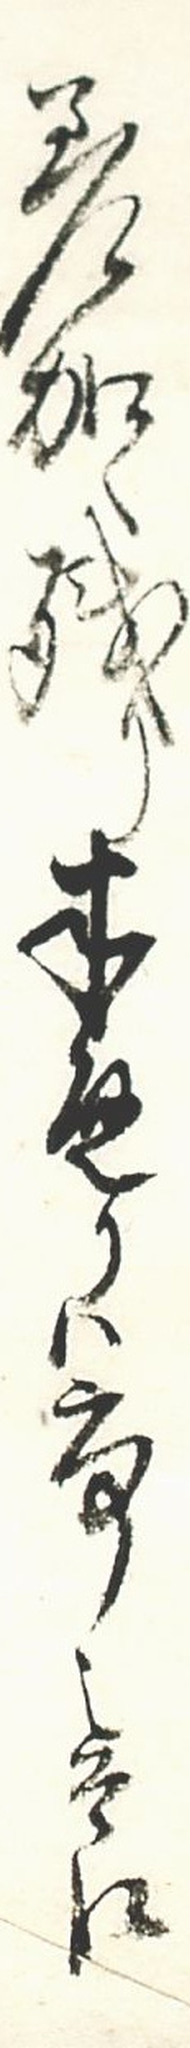差加へ残り半通りは高之節
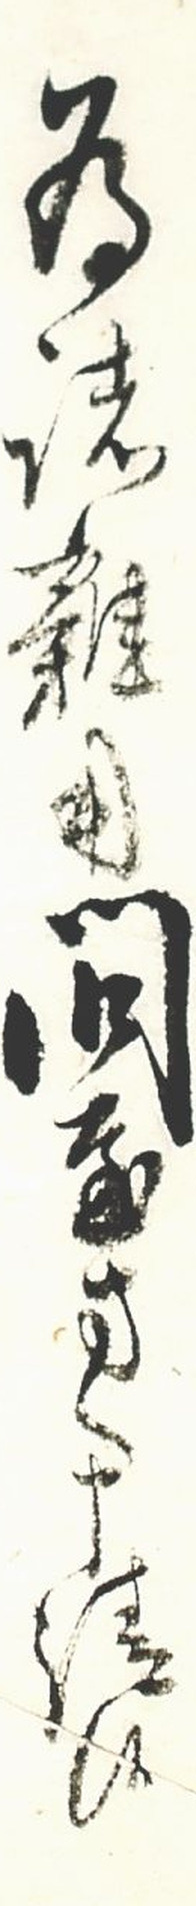為諸雑用問屋方へ申請候
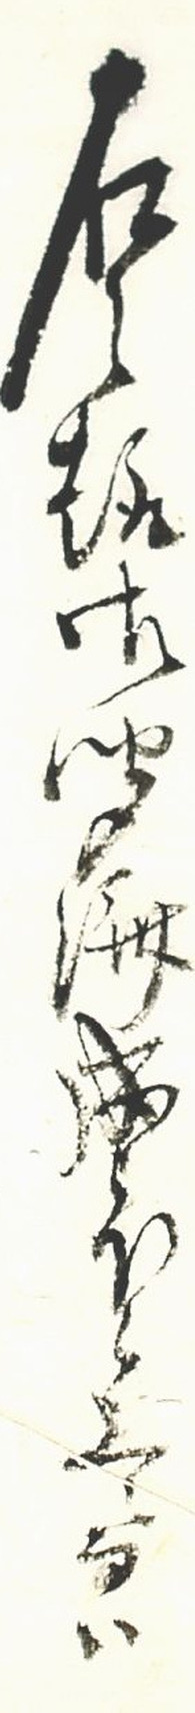右之趣御聞済成被下候上に而は
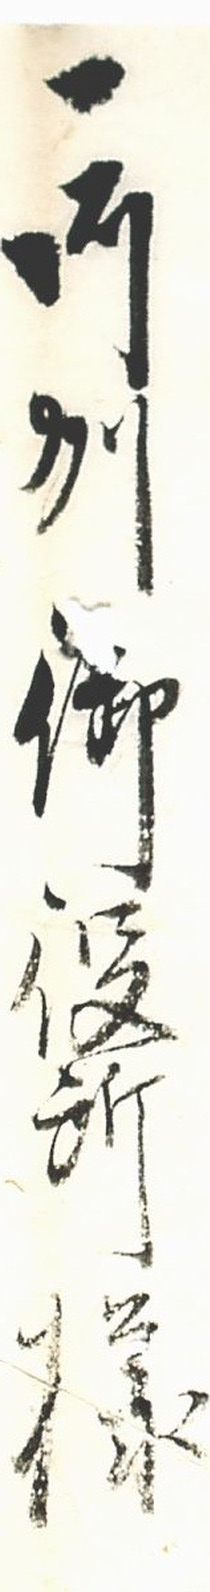一阿州御役所様
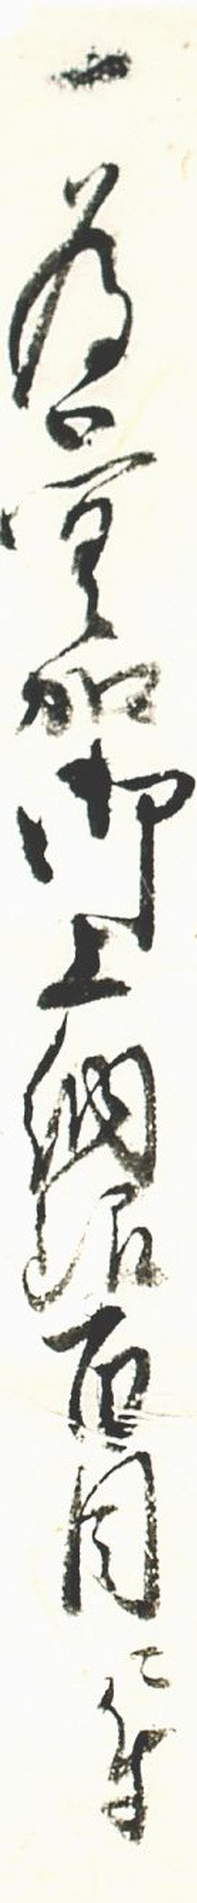一為御冥加御上納銀百目に付
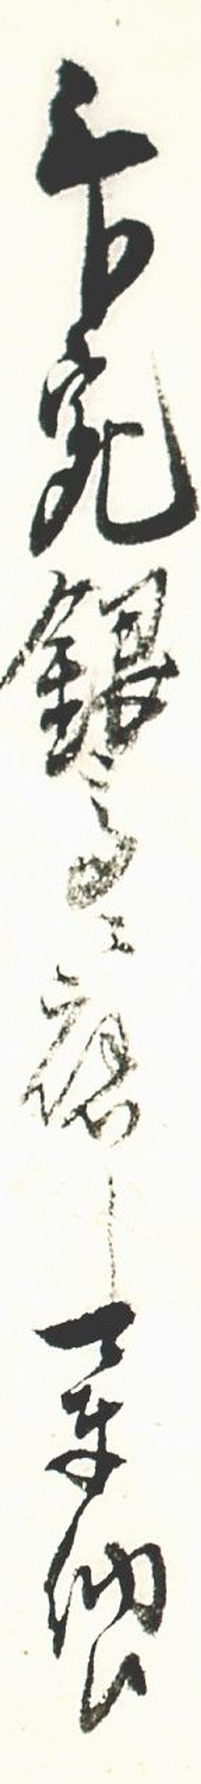三分宛銀高に応し可奉納候
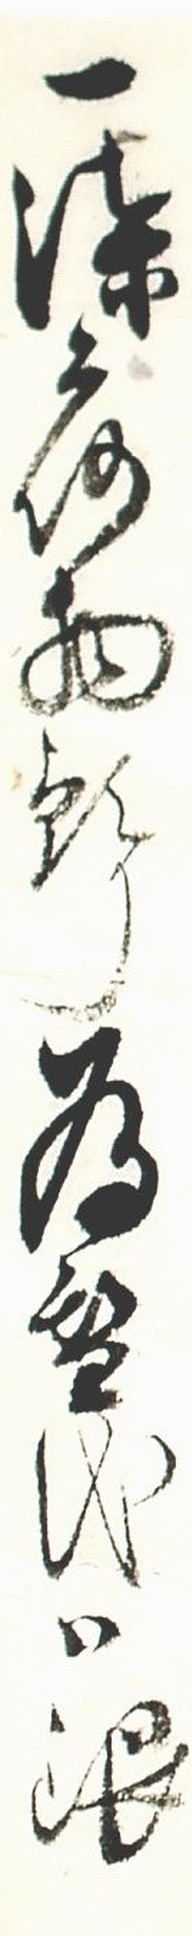一漆荷物預り為替代は銀
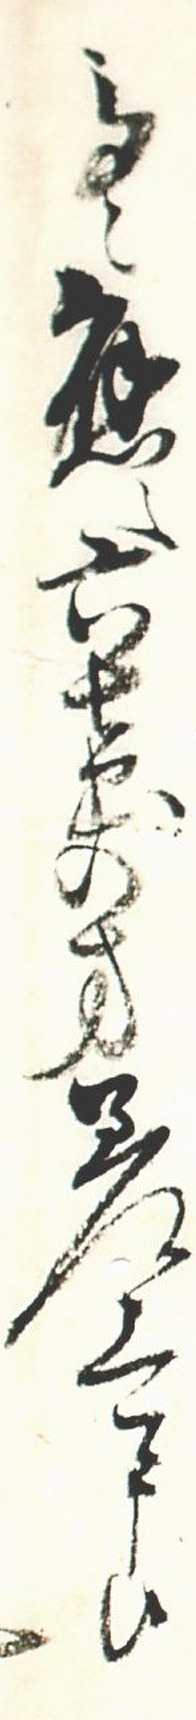高に応し六七歩方差上可申候
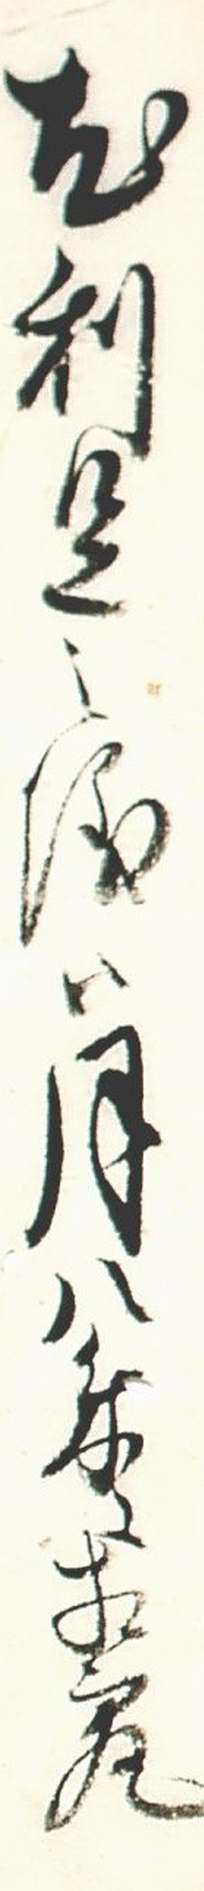尤利足之儀は月八朱に相究
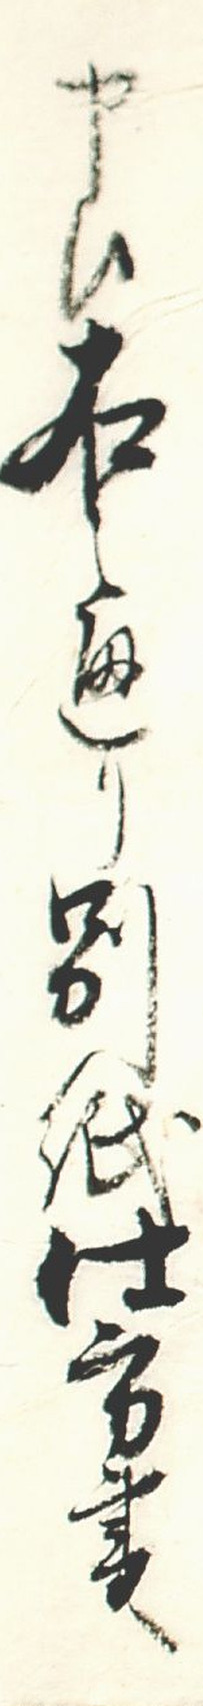申候右之通り別紙仕方書へ
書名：漆買捌方之事（漆売却約定書）
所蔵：鳴門教育大学 Naruto University of Education
